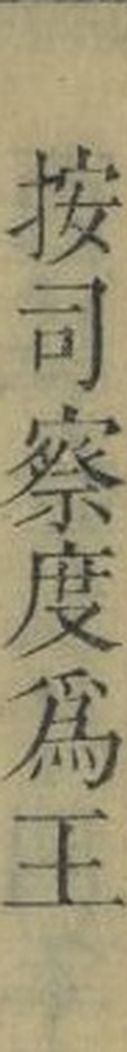按司察度為王
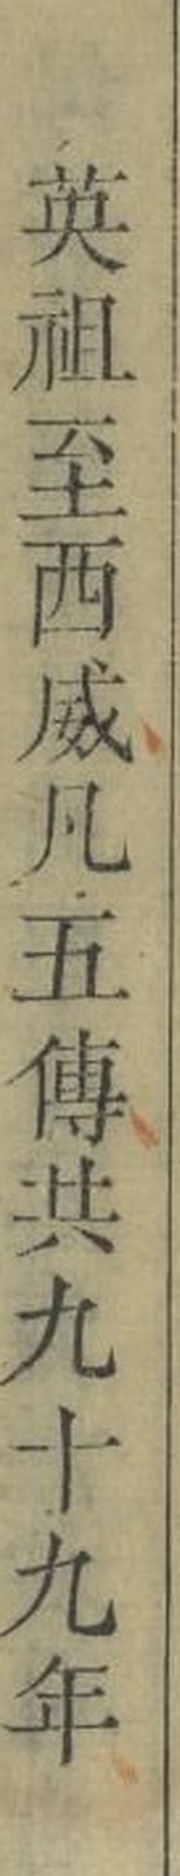英祖至西威凡五伝共九十九年
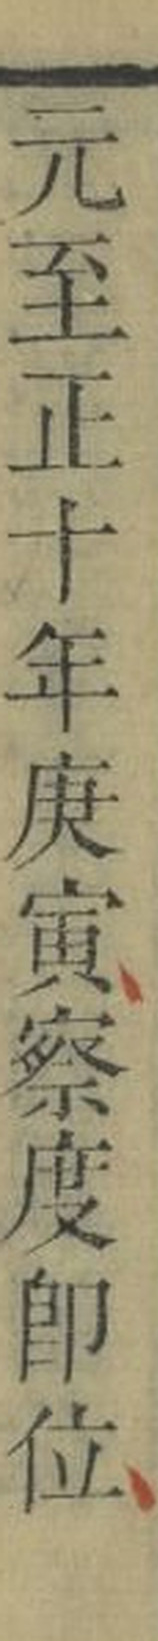元至正十年庚寅察度即位
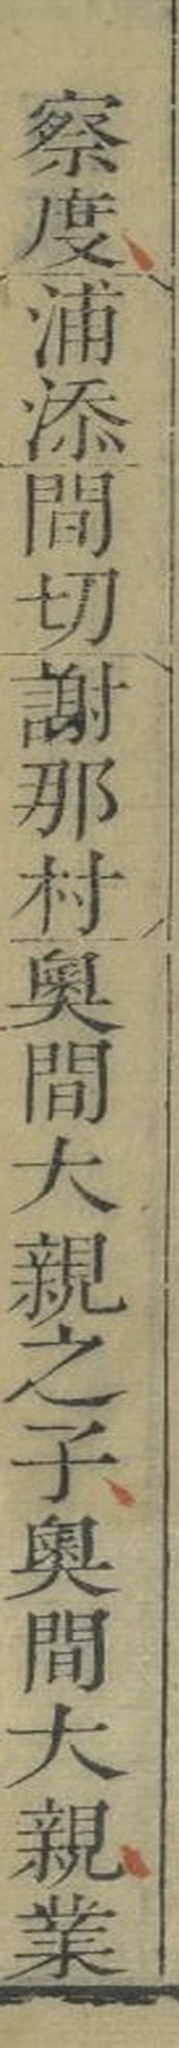察度[浦添]間切[謝那村]奥間大親之子奥間大親業
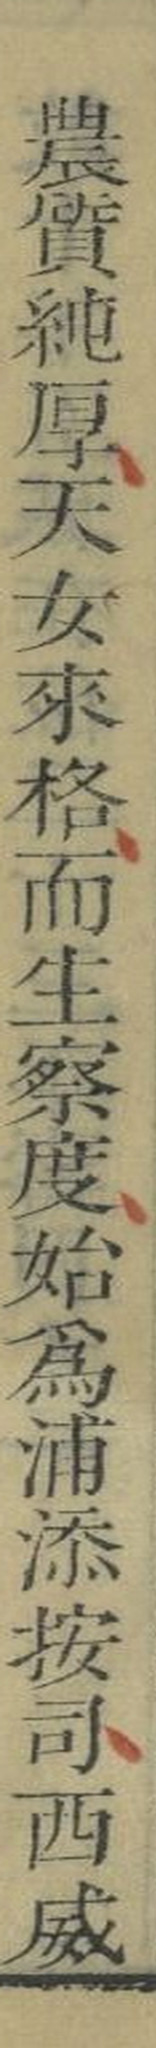農質純厚天女来格而生察度始為浦添按司西威
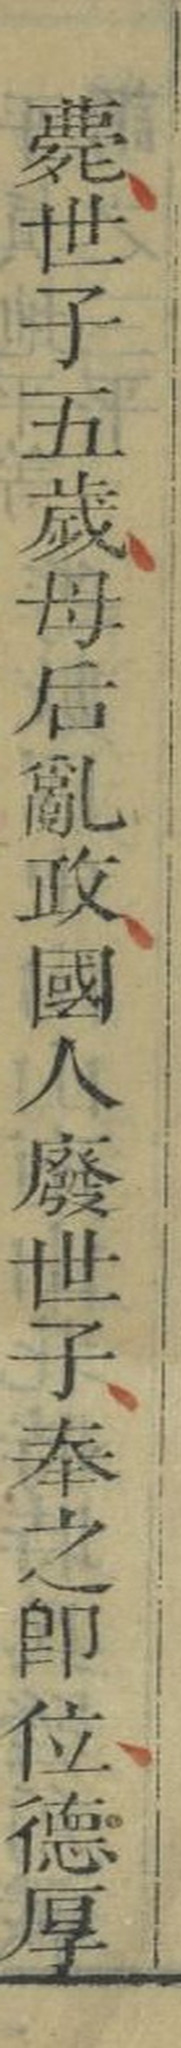薨世子五歳母后乱政国人廃世子奉之即位徳厚
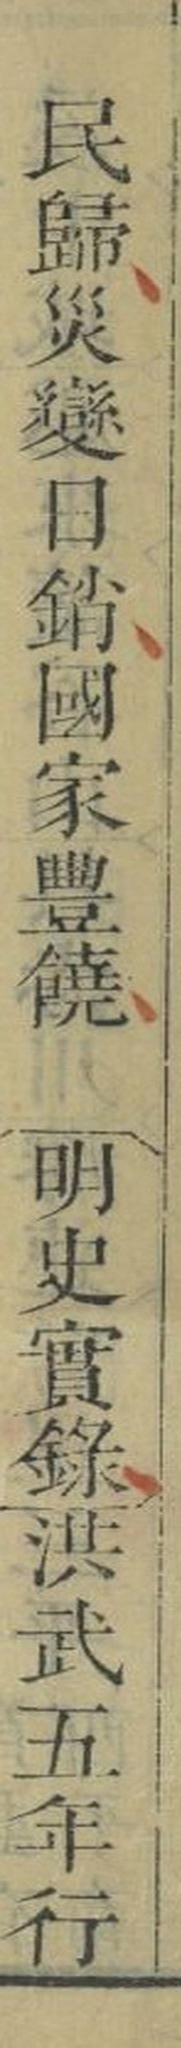民帰災変日銷国家豊饒[明史実録]洪武五年行
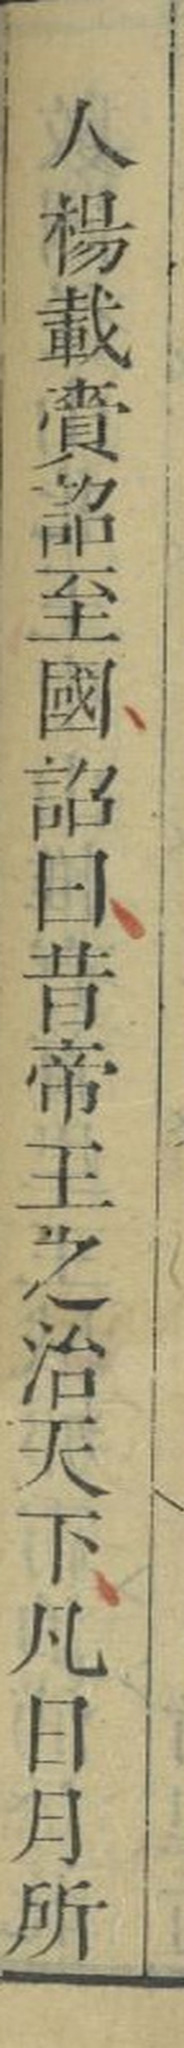人楊載賚詔至国詔曰昔帝王之治天下凡日月所
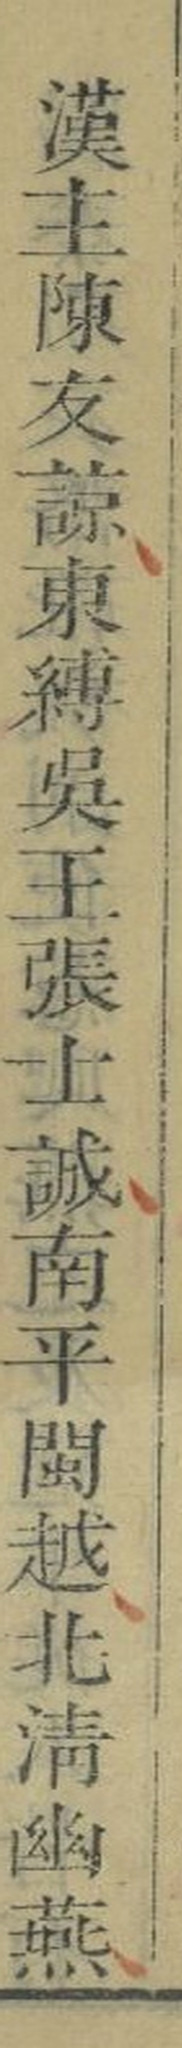漢主陳友諒東縛呉王張士誠南平閩越北清幽燕
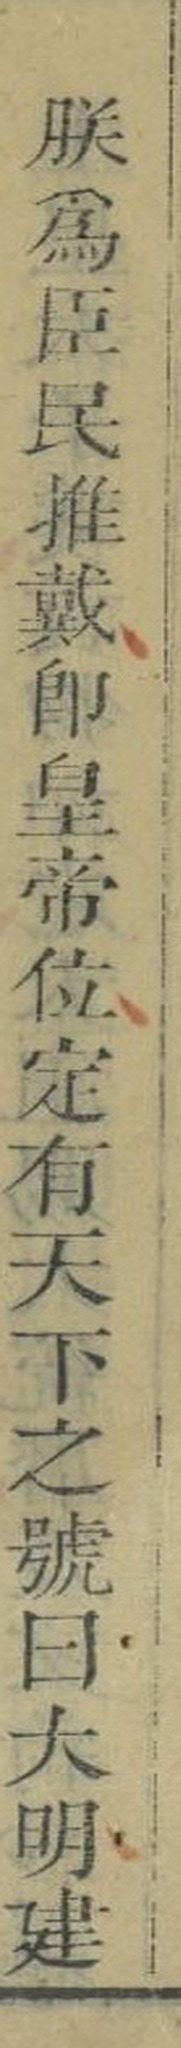朕為臣民推戴即皇帝位定有天下之号曰大明建
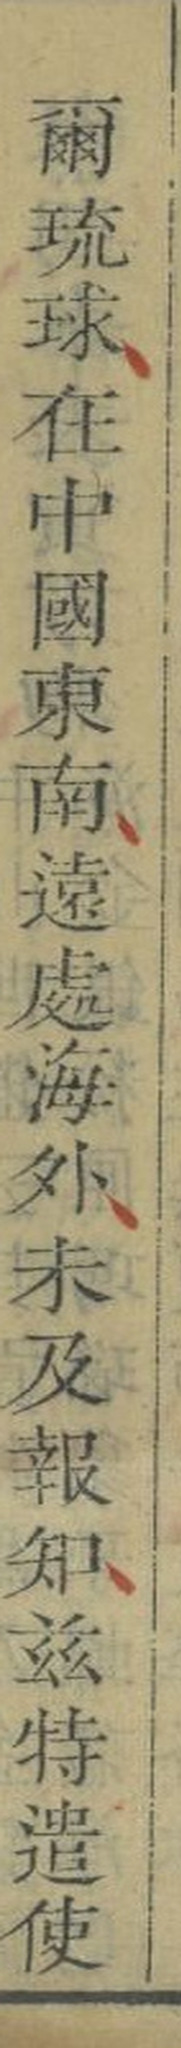爾琉球在中国東南遠処海外未及報知茲特遣使

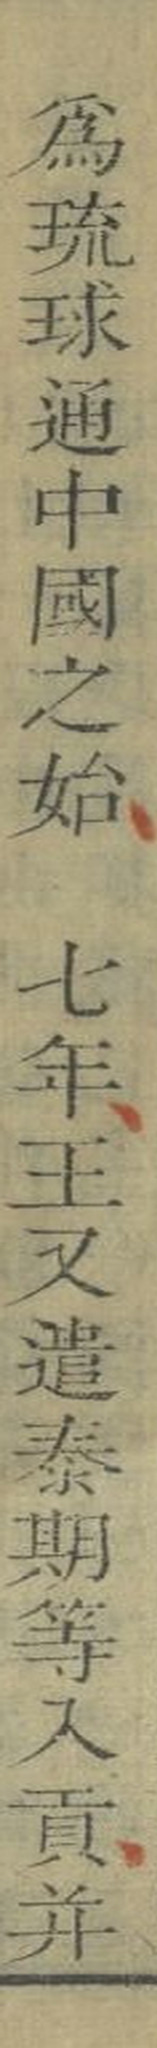為琉球通中国之始七年王又遣泰期等入貢并
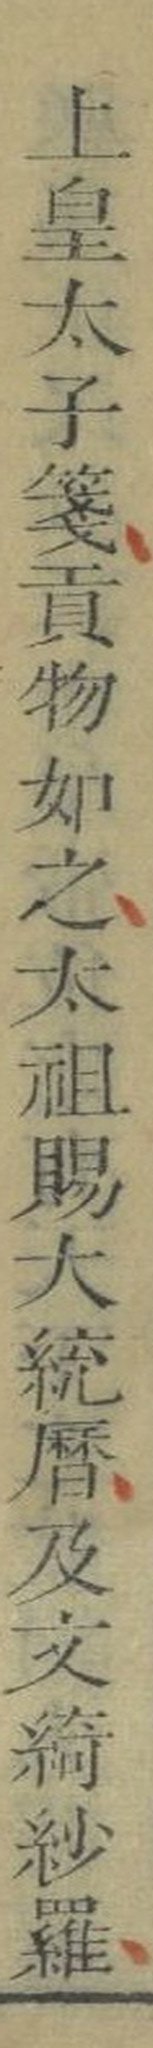上皇太子箋貢物如之太祖賜大統暦及文綺紗羅
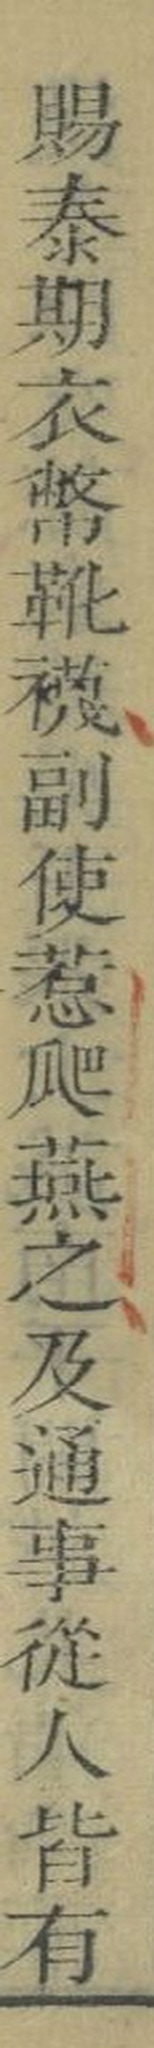賜泰期衣幣靴襪副使惹爬燕之及通事従人皆有
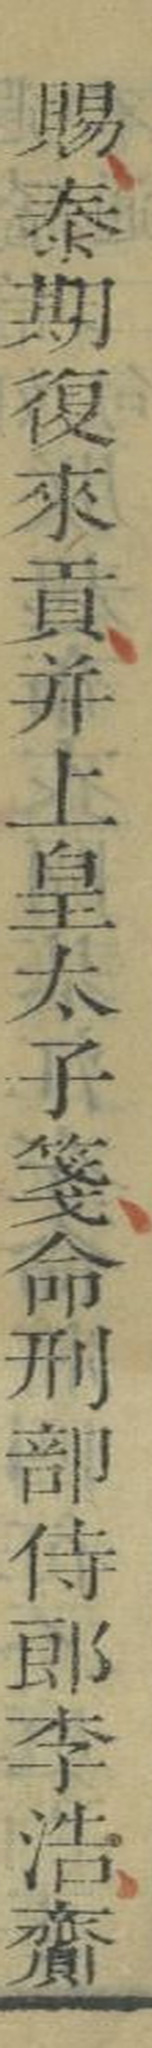賜泰期復来貢并上皇太子箋命刑部侍郎李浩齎
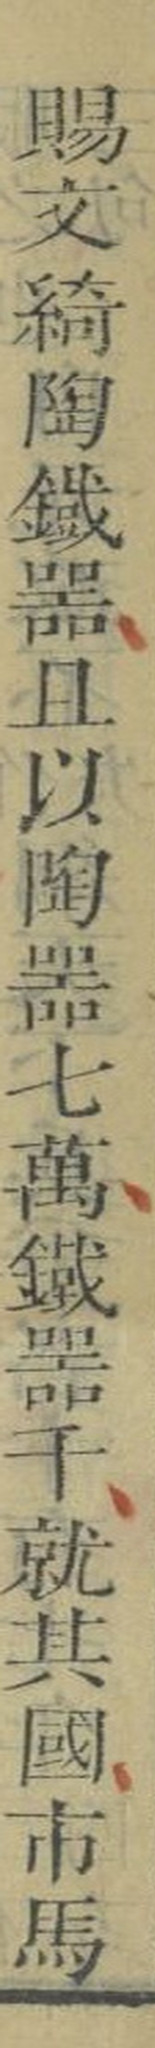賜文綺陶鉄器且以陶器七万鉄器千就其国市馬
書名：中山伝信録 巻三
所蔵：University of the Ryukyus Library
